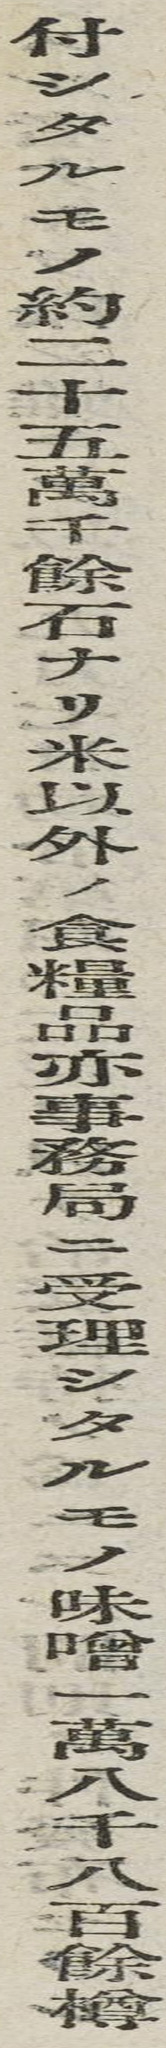付シタルモノ約二十五万千余石ナリ米以外ノ食糧品亦事務局ニ受理シタルモノ味噌一万八千八百余樽
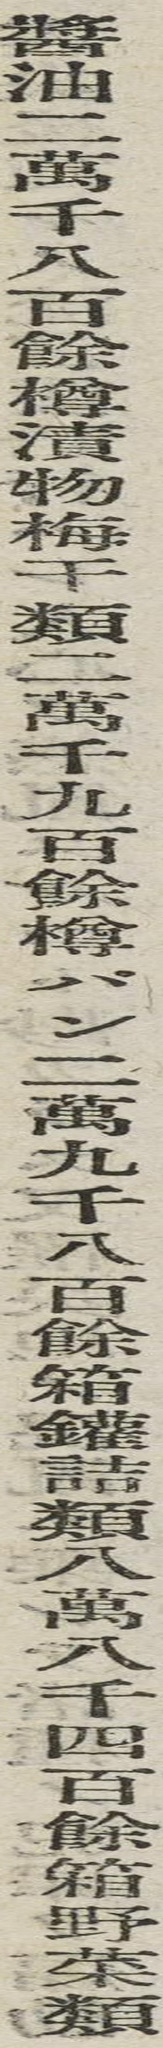醤油二万千八百余樽漬物梅干類二万千九百余樽パン二万九千八百余箱缶詰類八万八千四百余箱野菜類
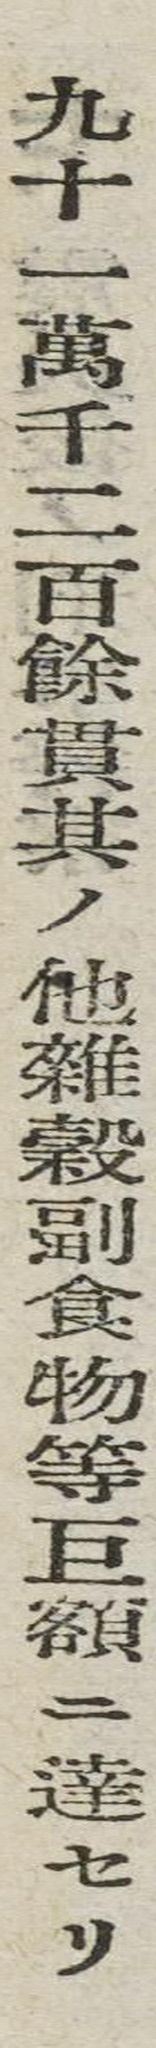九十一万千二百余貫其ノ他雑穀副食物等巨額ニ達セリ
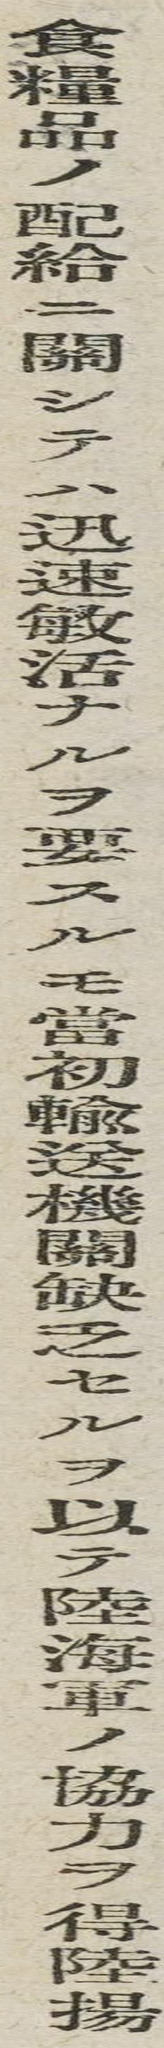食糧品ノ配給ニ関シテハ迅速敏活ナルヲ要スルモ当初輸送機関欠乏セルヲ以テ陸海軍ノ協力ヲ得陸揚
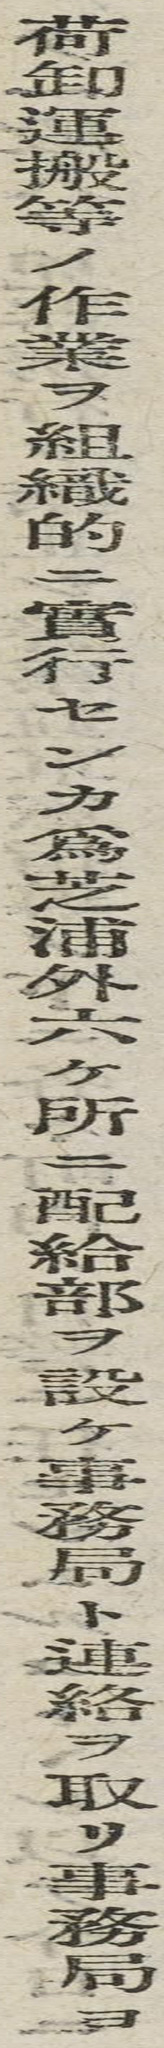荷卸運搬等ノ作業ヲ組織的ニ実行センカ為芝浦外六ケ所ニ配給部ヲ設ケ事務局ト連絡ヲ取リ事務局ヨ
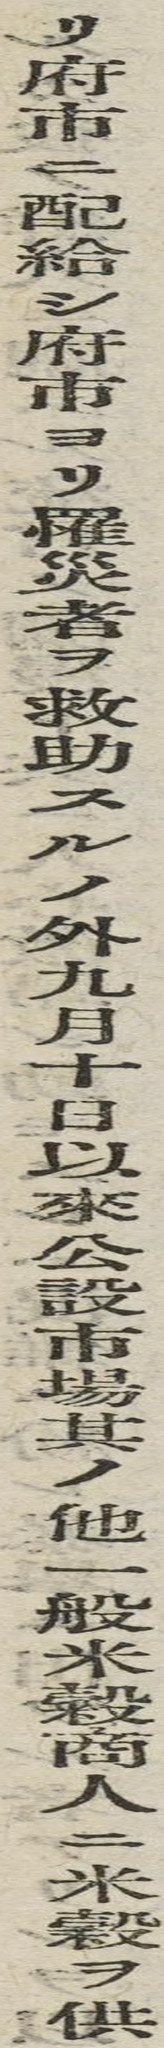リ府市ニ配給シ府市ヨリ罹災者ヲ救助スルノ外九月十日以来公設市場其ノ他一般米穀商人ニ米穀ヲ供
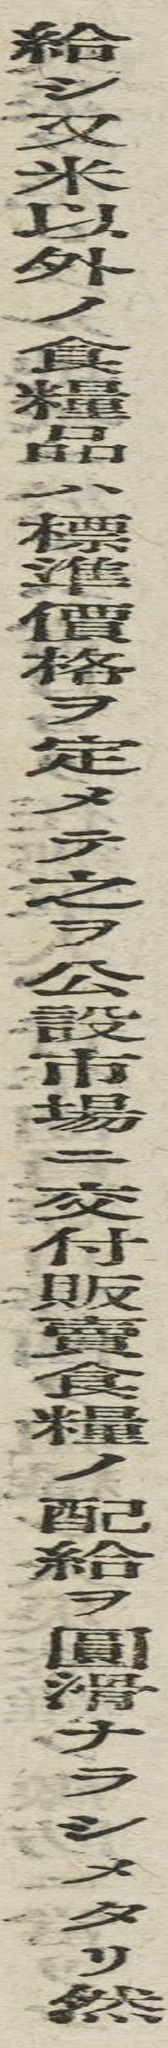給シ又米以外ノ食糧品ハ標準価格ヲ定メテ之ヲ公設市場ニ交付販売食糧ノ配給ヲ円滑ナラシメタリ然
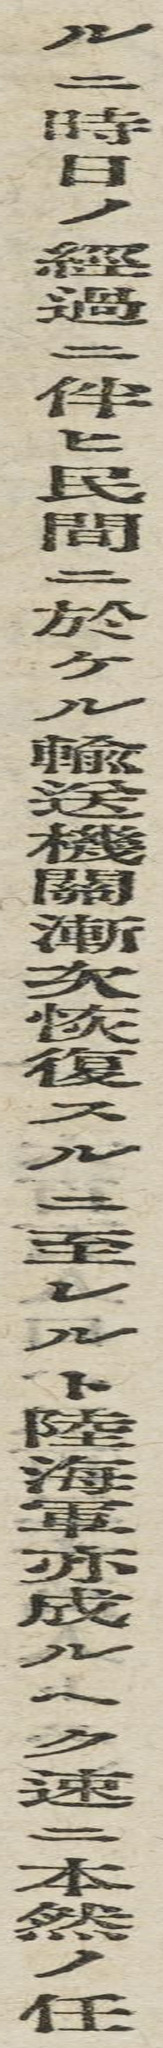ルニ時日ノ経過ニ伴ヒ民間ニ於ケル輸送機関漸次回復スルニ至レルト陸海軍亦成ルヘク速ニ本然ノ任
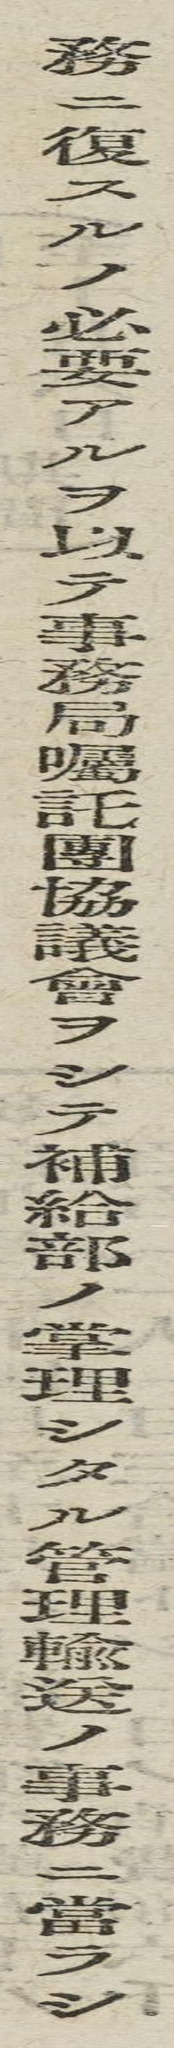務ニ復スルノ必要アルヲ以テ事務局嘱託団協議会ヲシテ補給部ノ掌理シタル管理輸送ノ事務ニ当ラシ
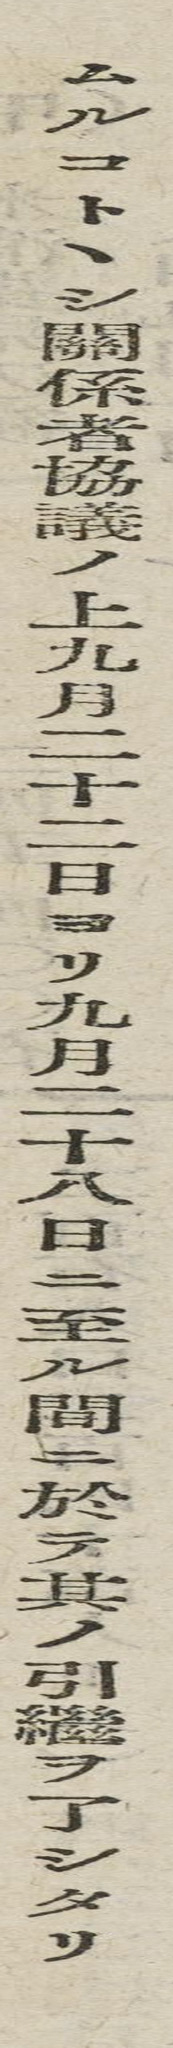ムルコトヽシ関係者協議ノ上九月二十二日ヨリ九月二十八日ニ至ル間ニ於テ其ノ引継ヲ了シタリ
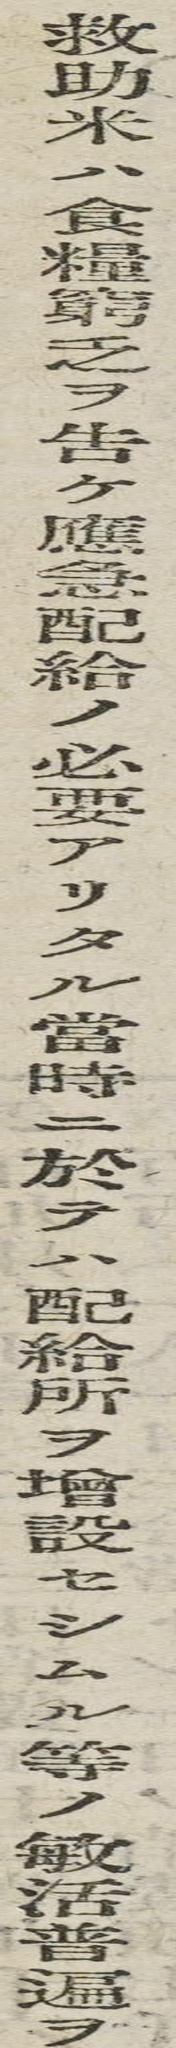救助米ハ食糧窮乏ヲ告ケ応急配給ノ必要アリタル当時ニ於テハ配給所ヲ増設セシムル等ノ敏活普遍ヲ
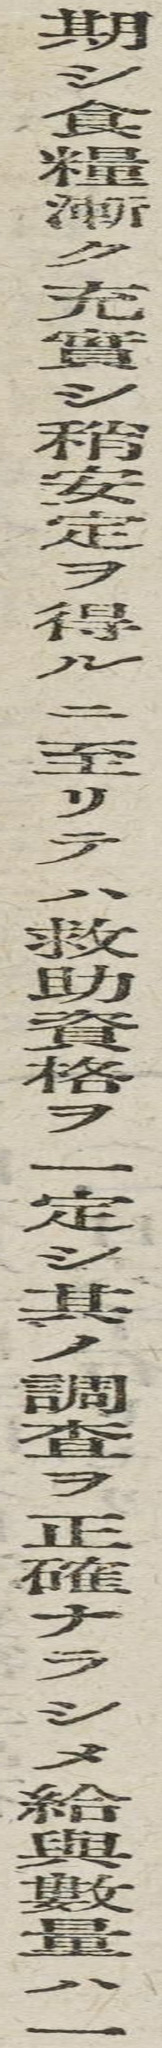期シ食糧漸ク充実シ稍安定ヲ得ルニ至リテハ救助資格ヲ一定シ其ノ調査ヲ正確ナラシメ給与数量ハ一
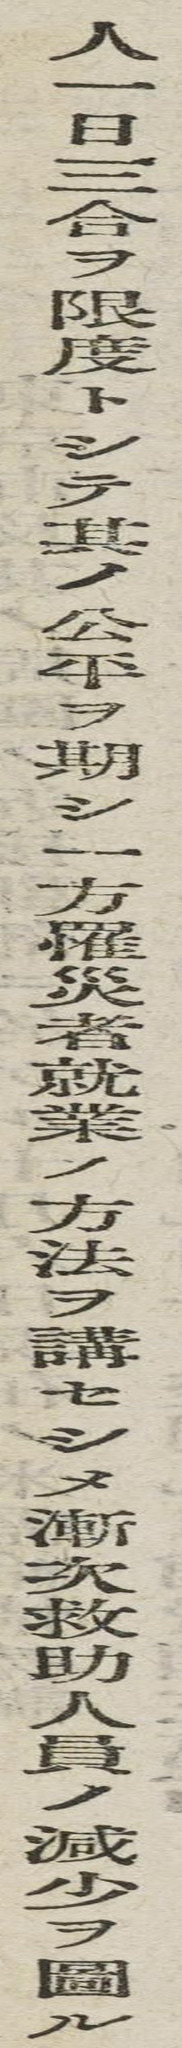人一日三合ヲ限度トシテ其ノ公平ヲ期シ一方罹災者就業ノ方法ヲ講セシメ漸次救助人員ノ減少ヲ図ル
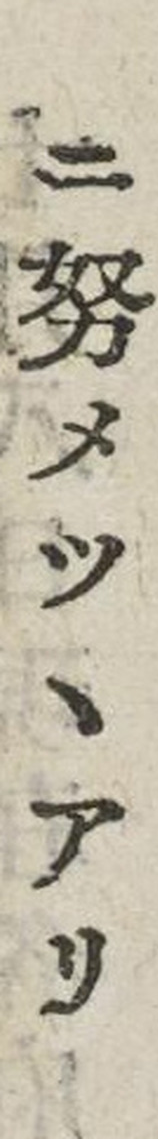ニ努メツヽアリ
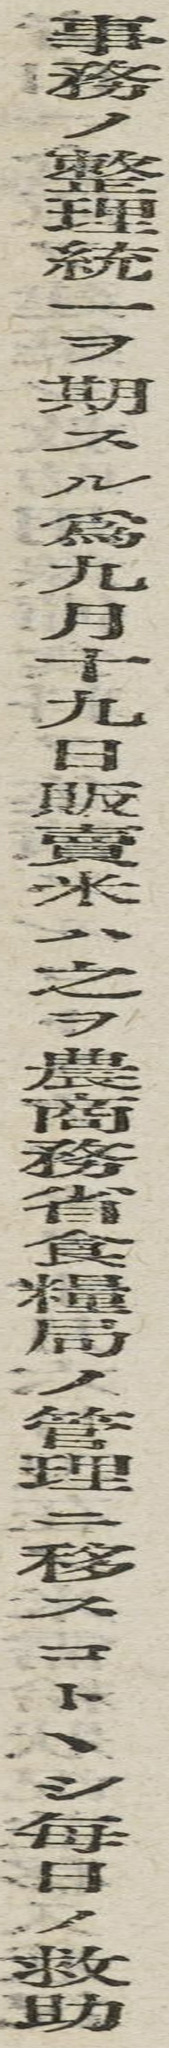事務ノ整理統一ヲ期スル為九月十九日販売米ハ之ヲ農商務省食糧局ノ管理ニ移スコトヽシ毎日ノ救助
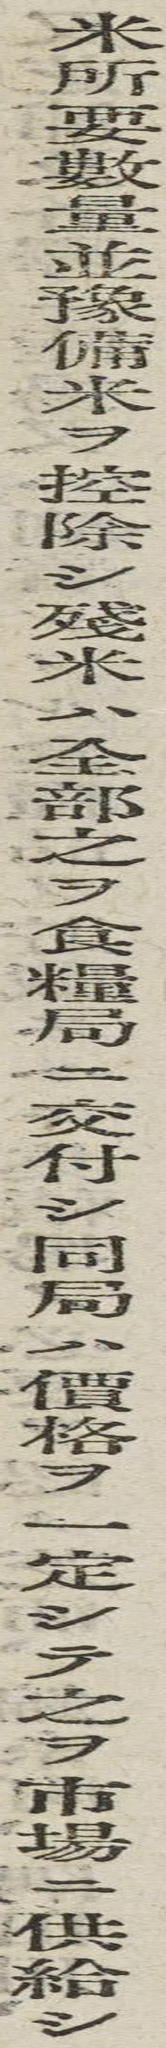米所用数量並予備米ヲ控除シ残米ハ全部之ヲ食糧局ニ交付シ同局ハ価格ヲ一定シテ之ヲ市場ニ供給シ
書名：震災被害状況並救護施設概要
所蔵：東京大学地震研究所図書室 Earthquake Research Institute Library, The University of Tokyo, JAPAN
